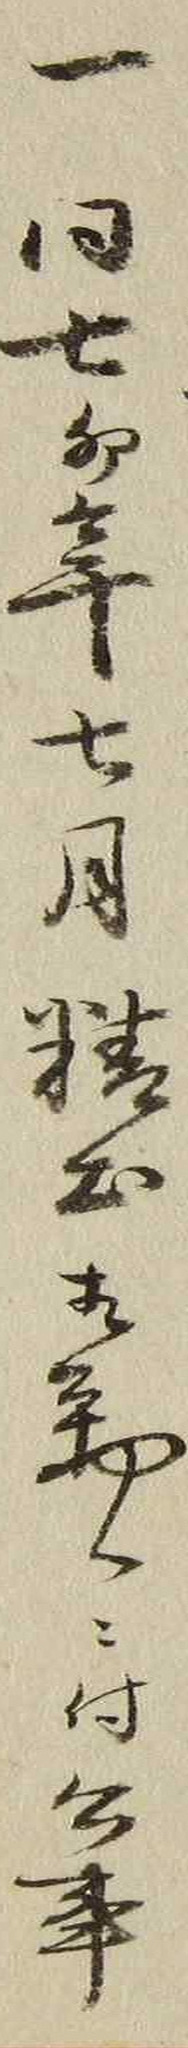一同七卯年七月精出相勤候ニ付公事
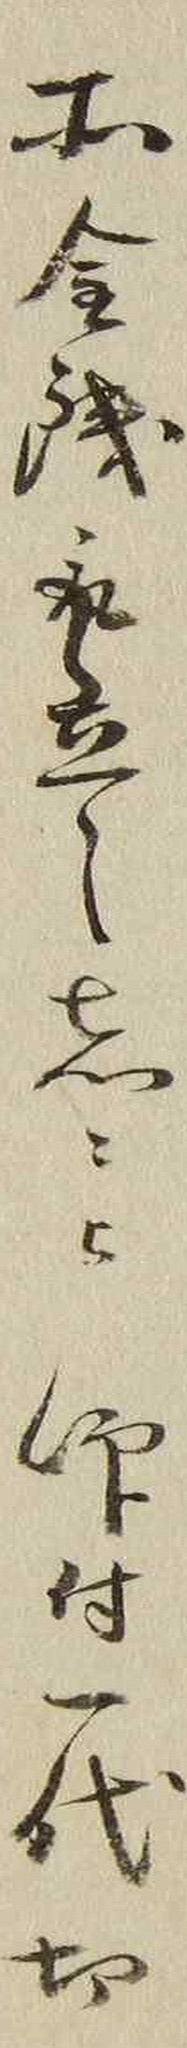所金銭取立之者ニ被仰付一代切
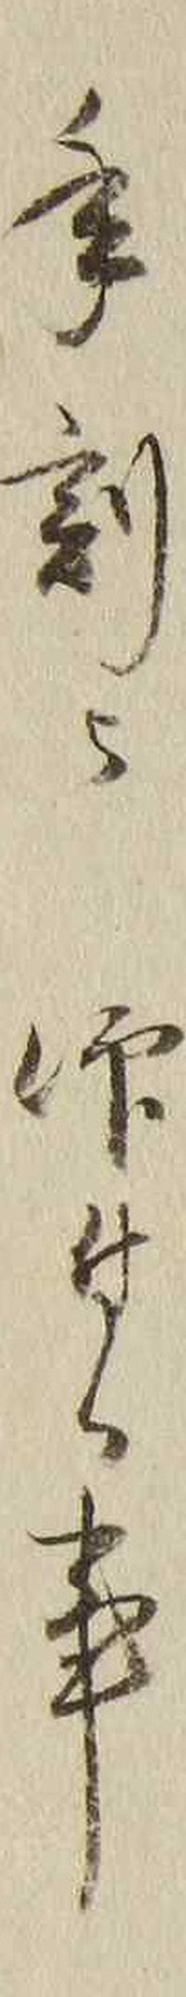年割被仰付候事
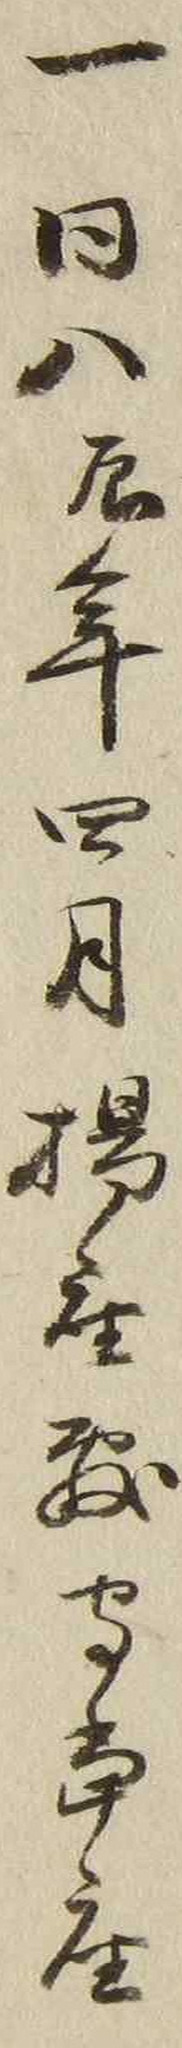一日八辰年四月揚座敷守当座

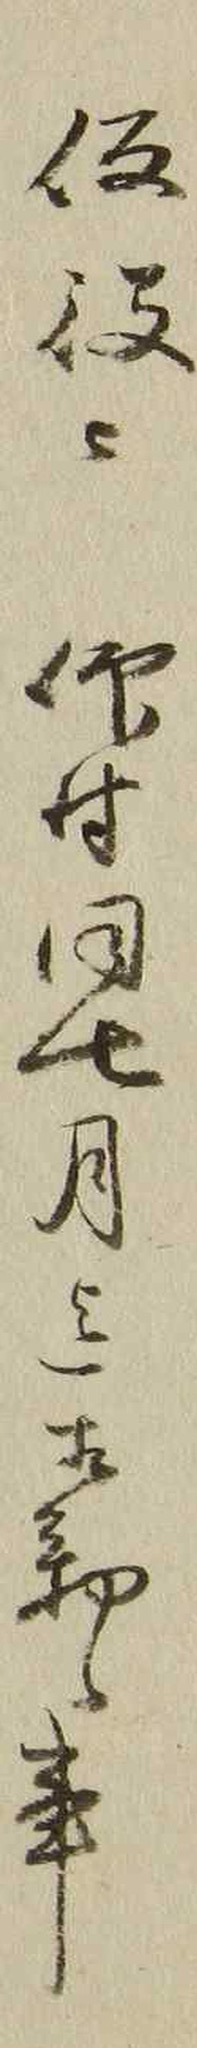仮役被仰付同七月迄相勤候事
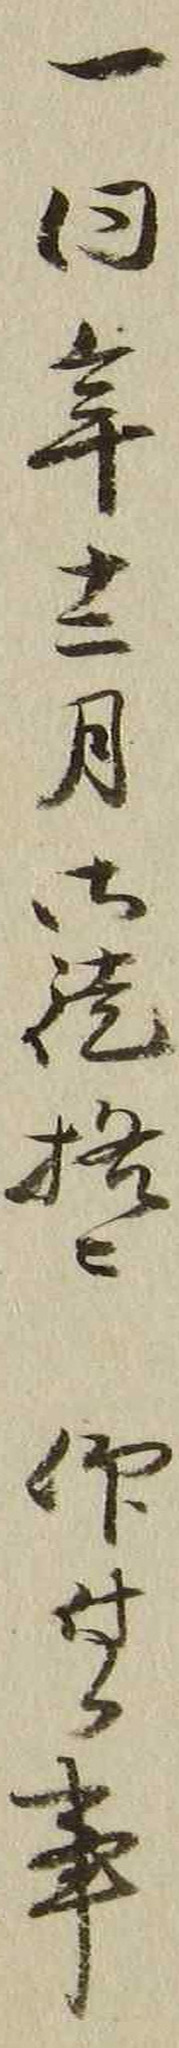一同年十二月御徒格被仰付候事
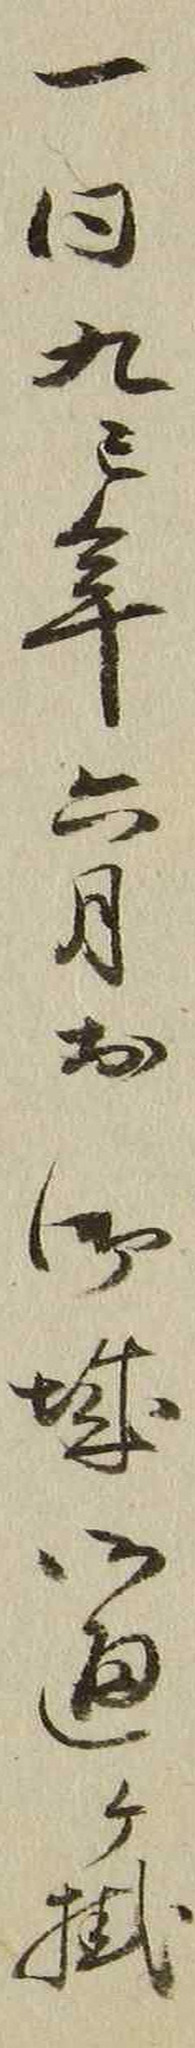一同九巳年六月於御城御通ヶ掛
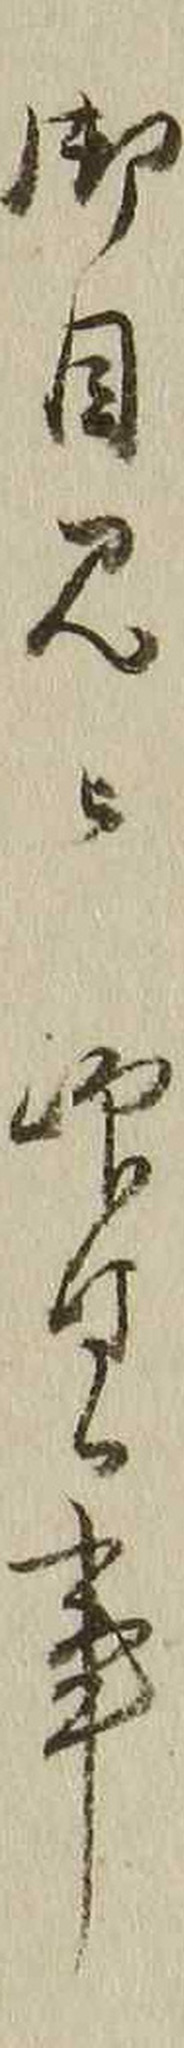御目見被仰付候事
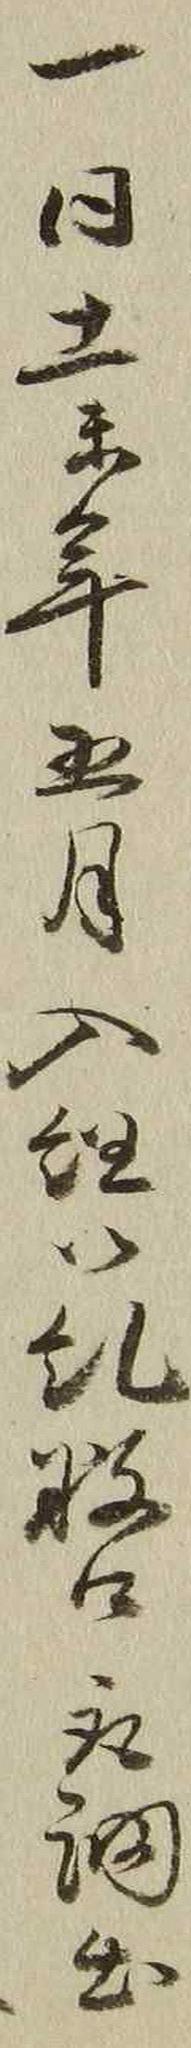一同十一未年五月入組御糺数口取調出
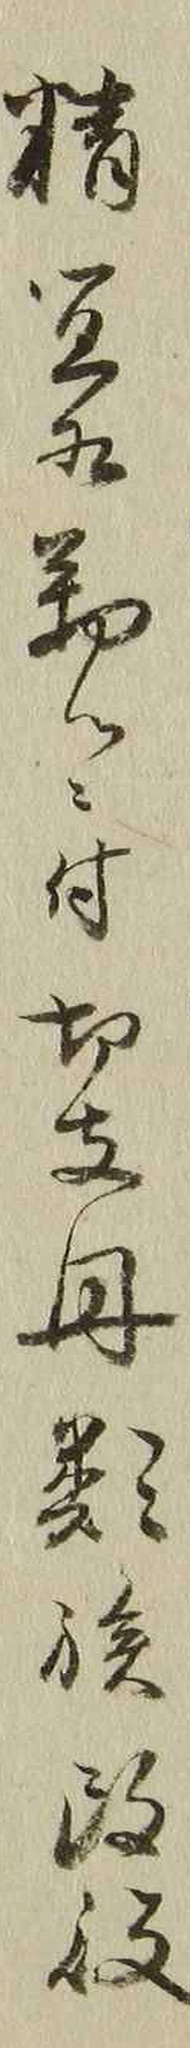精宜相勤候ニ付切支丹類族改役
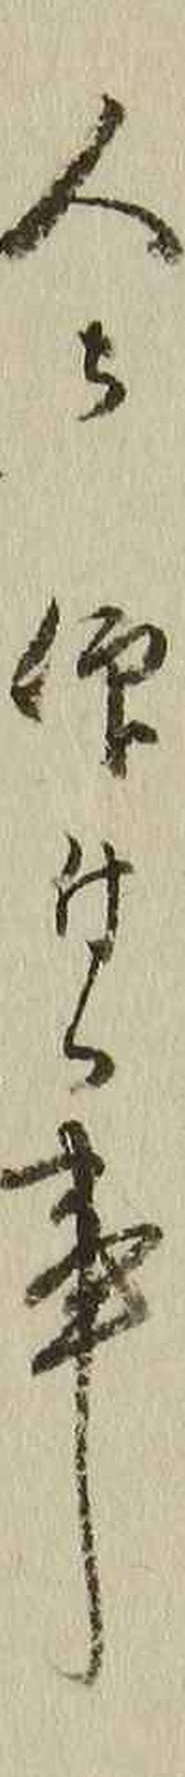人被仰付候事
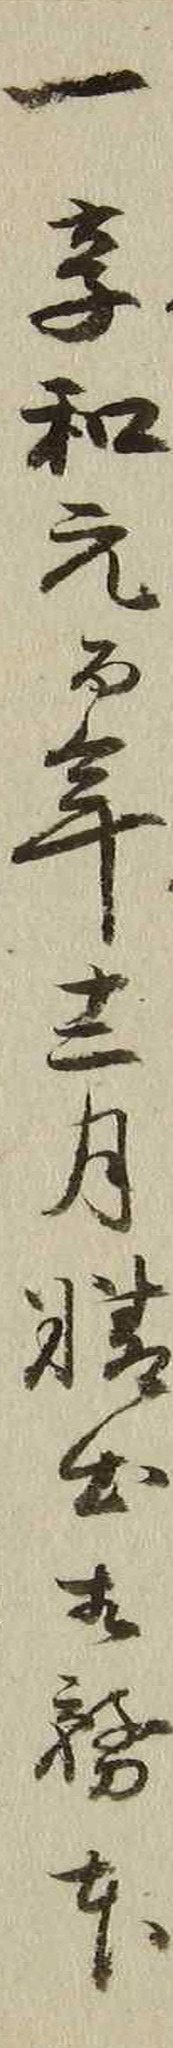一享和元酉年十二月精出相務本
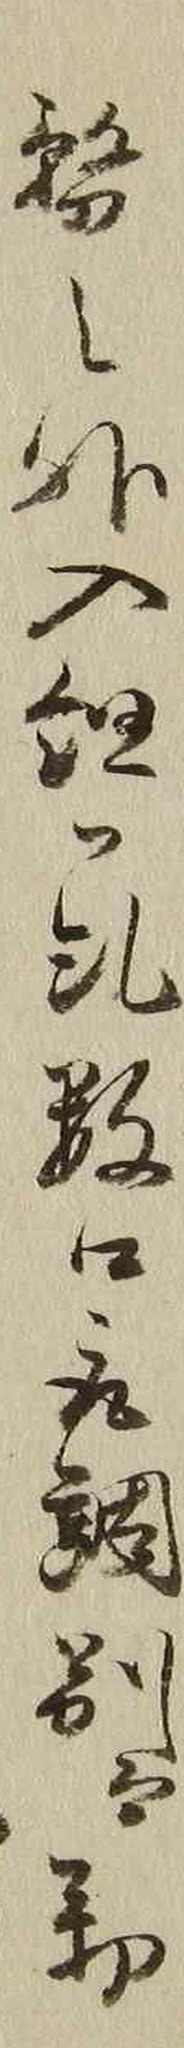務之外入組御糺数口取調別而勤
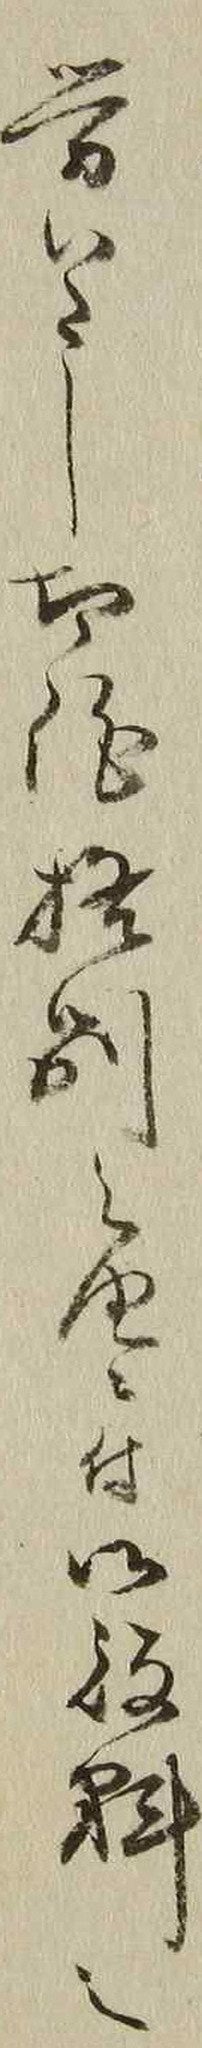労いたし功作格別之由ニ付御役料之
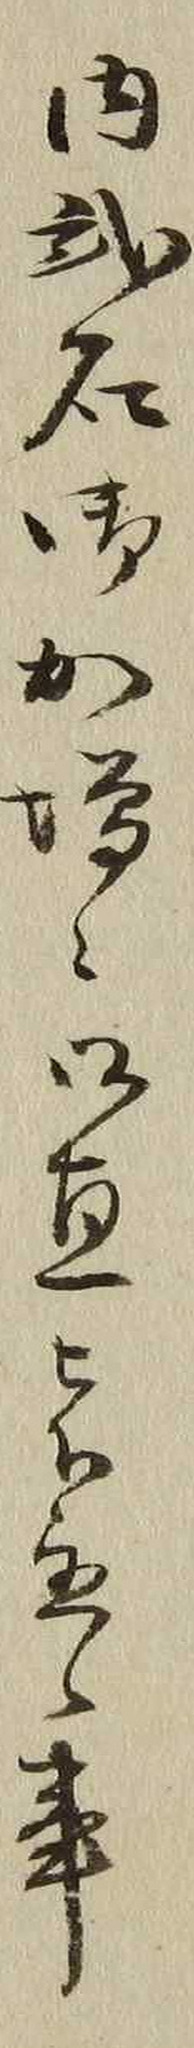内弐石御加増ニ御直被下置候事
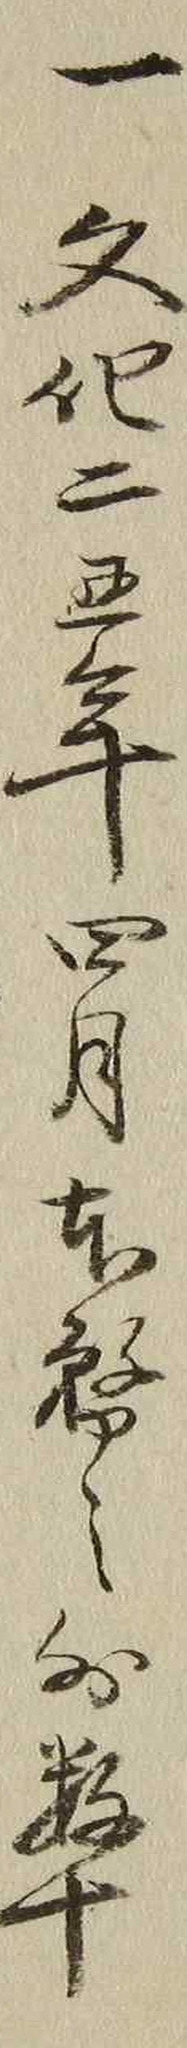一文化二丑年四月本務之外数十
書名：諸士系譜　巻之236　ふ之部4
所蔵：会津若松市立会津図書館
